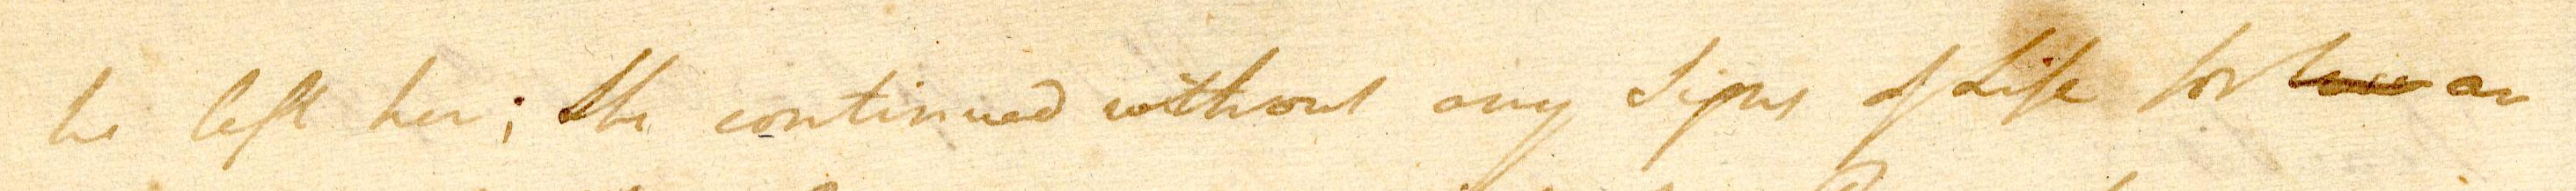he left her; She continued without any signs of Life for near an
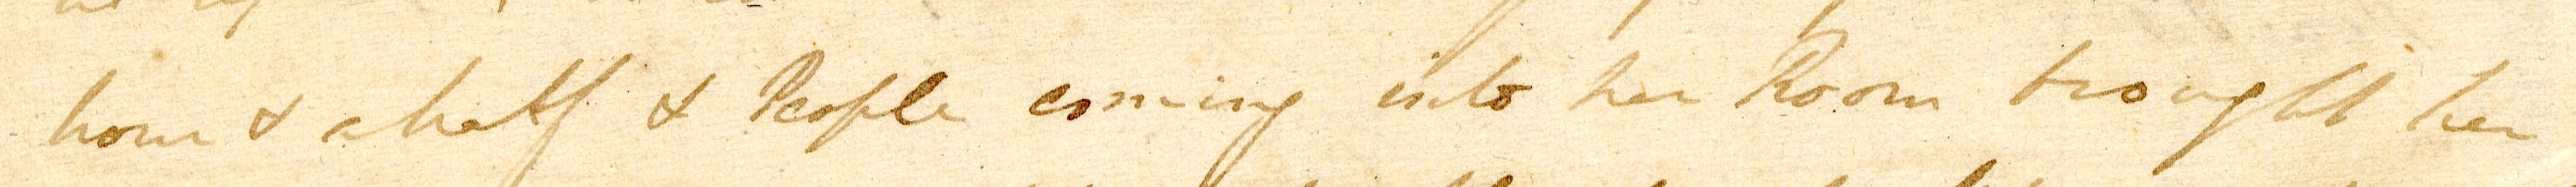hour & a half & People coming into her Room thought her
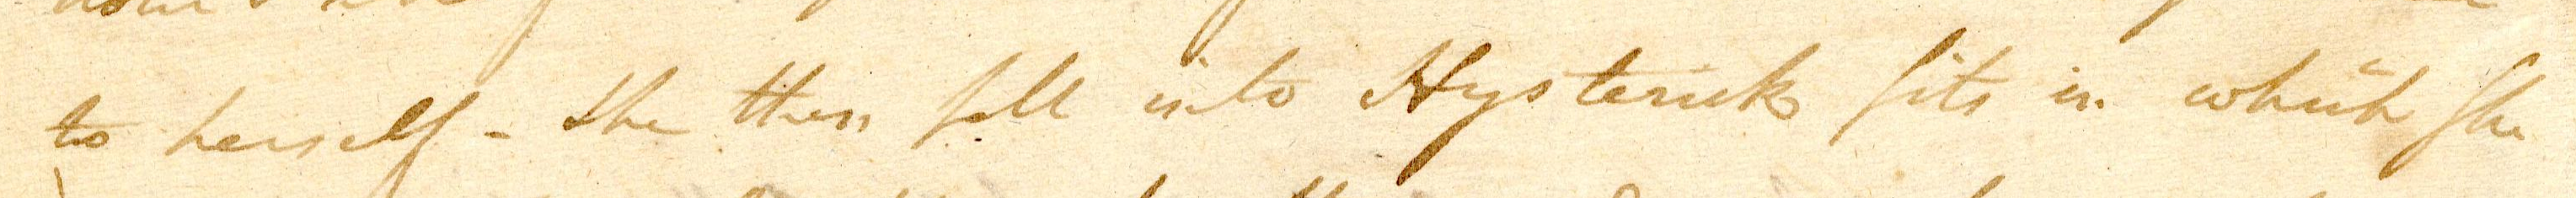to herself. she then fell into Hysterick fits in which she
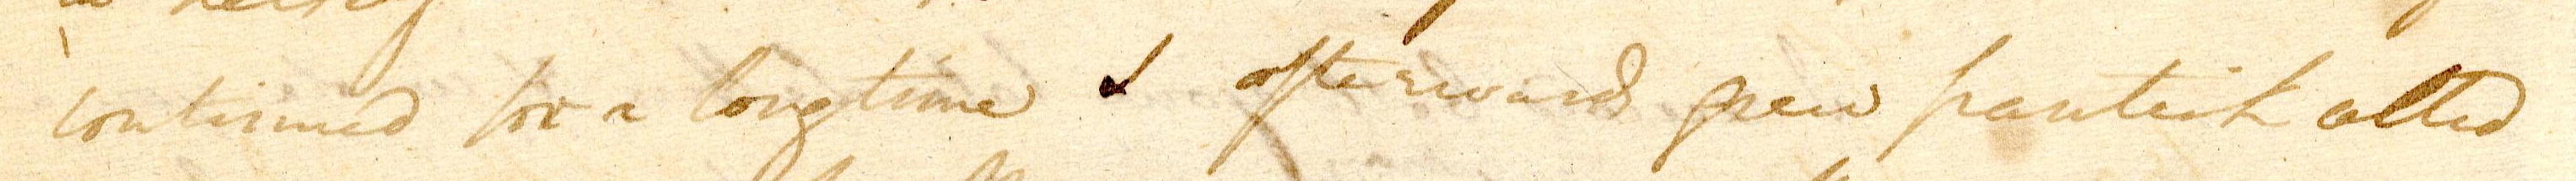continued for a longtime & afterward grew patient called
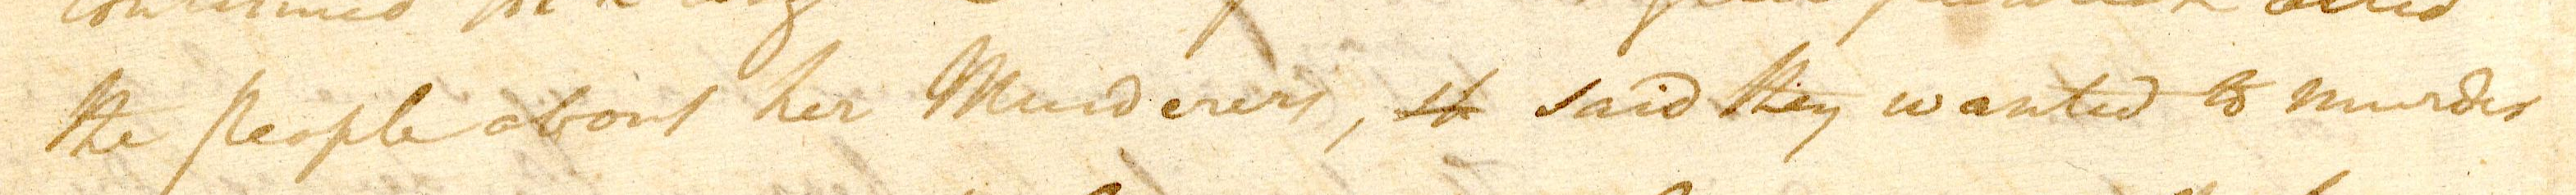the People about her Murderers, it said they wanted to murder
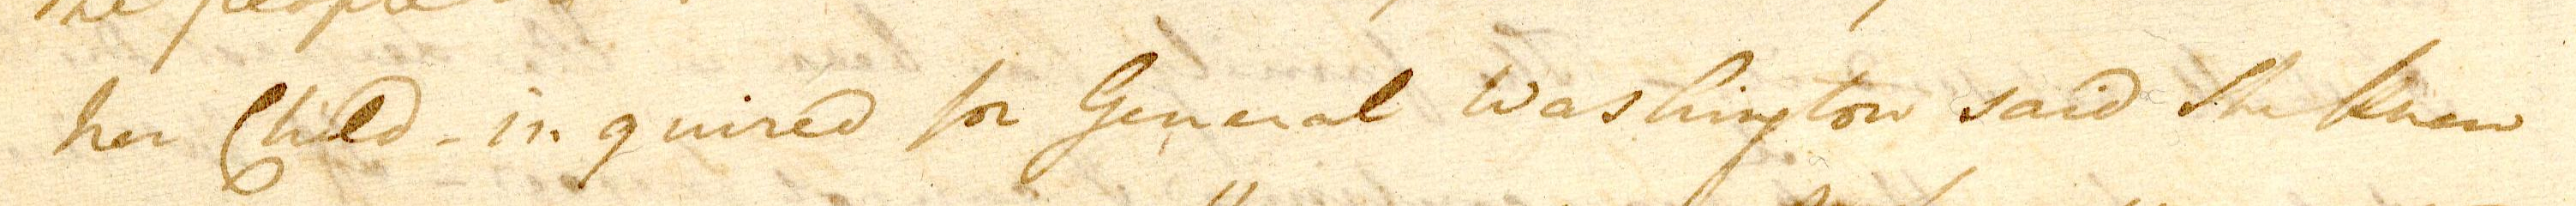her Child- inquired for General Washington said she knew
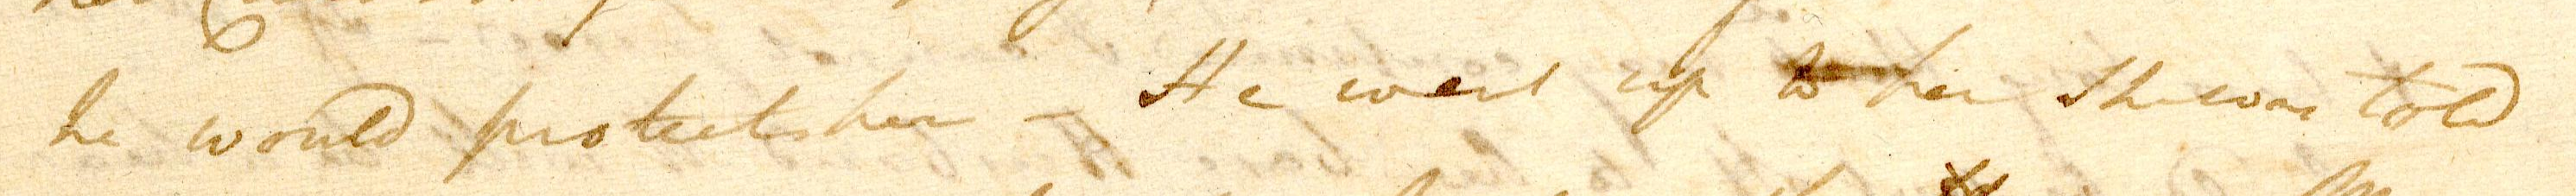he would protect her. He went up to her she was told
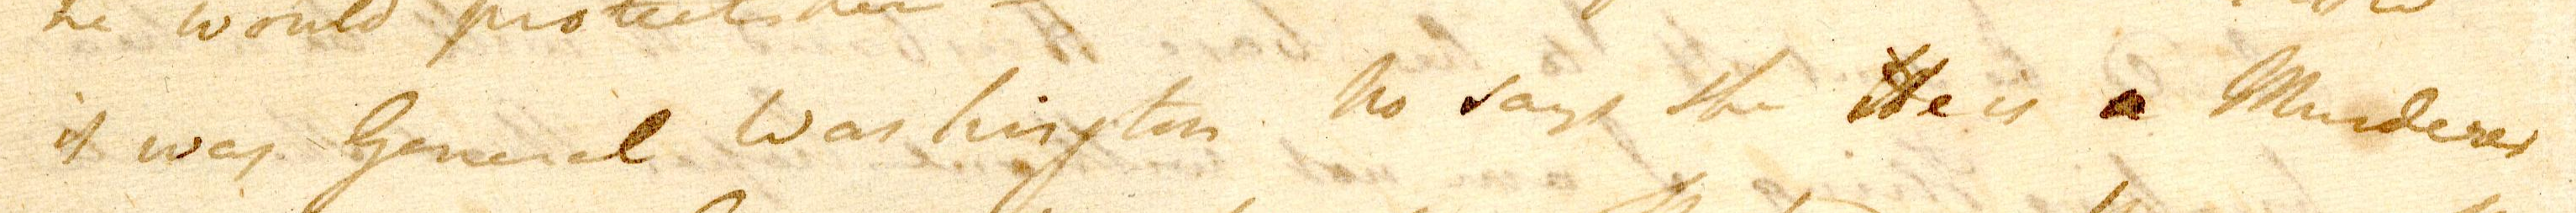it was General Washington no says she He is a Murderer
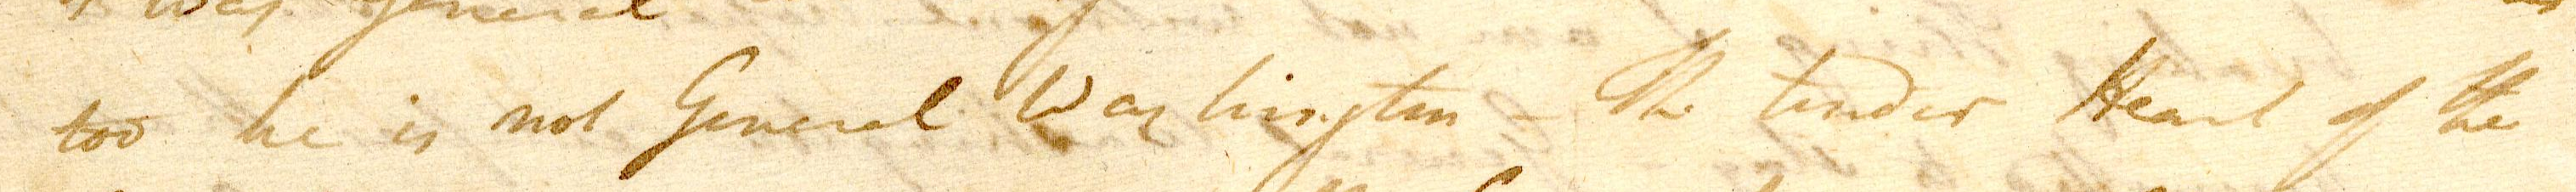too he is not General Washington. The tender Heart of the
